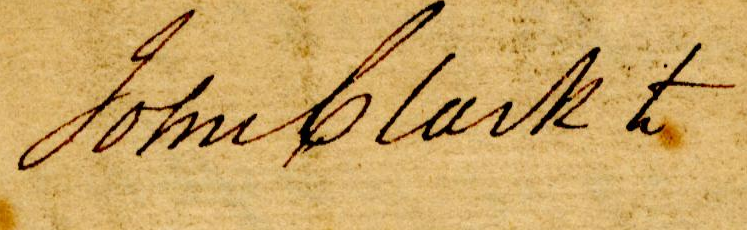John Clark to
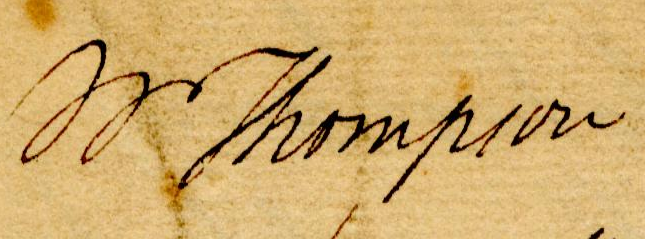M^r Thompson
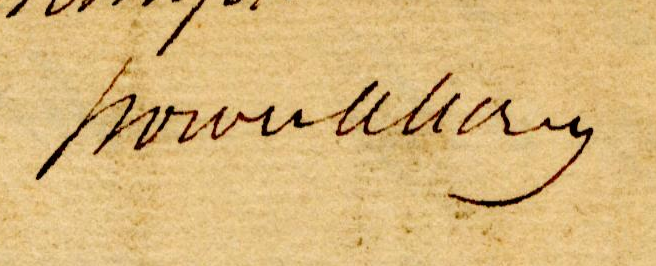power attry
